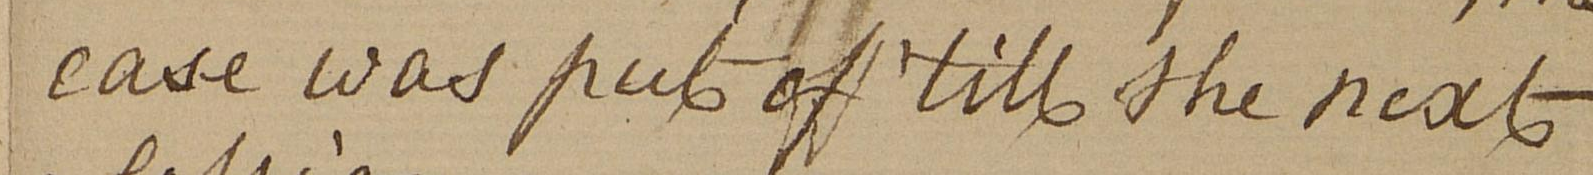case was put off till the next
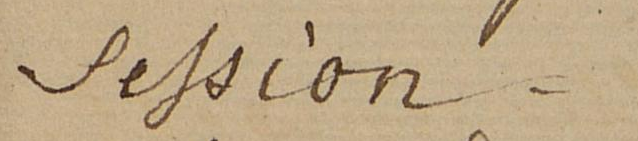Session-
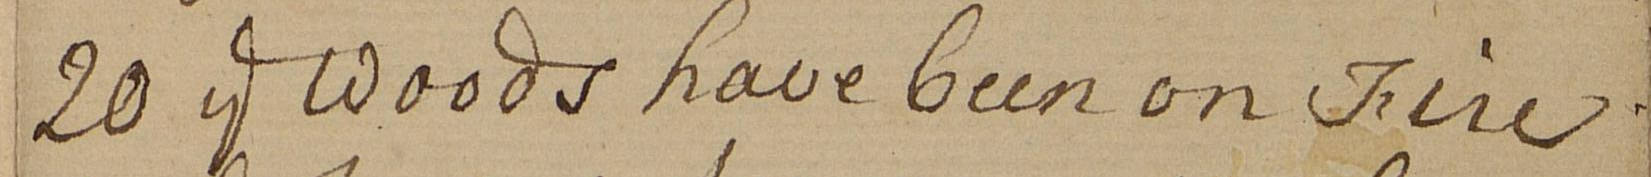20 y^e Woods have bun on Fire
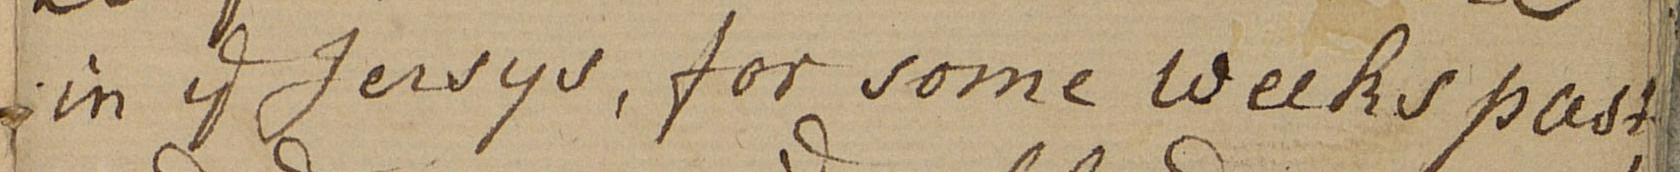in y^e Jersys, for some weeks past,
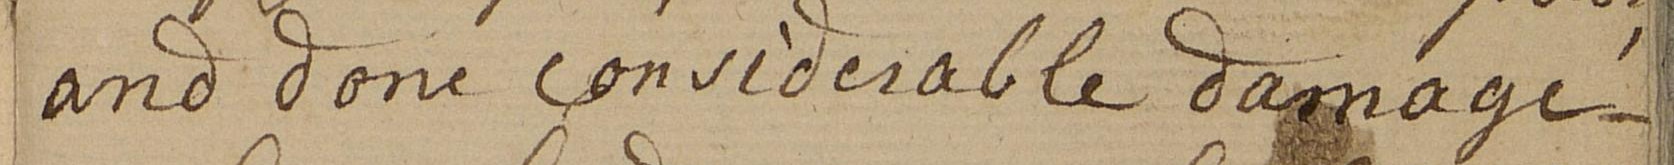and sone considerable damage-
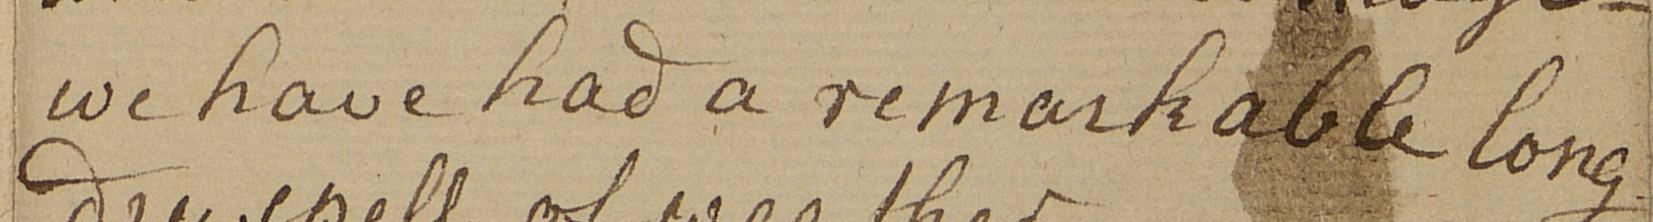we have has a remarkable long
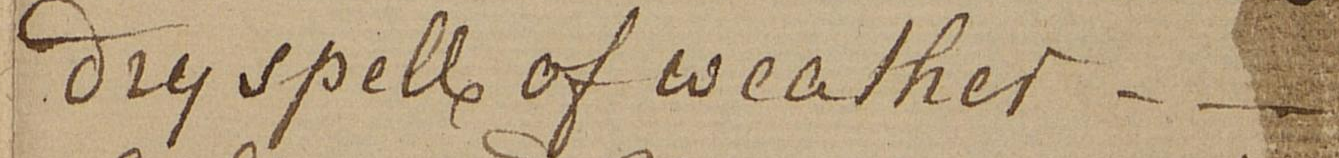dry spell of weather--
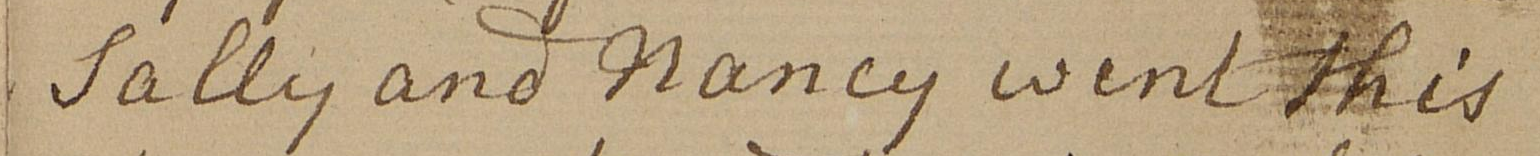Sally and Nancy went this
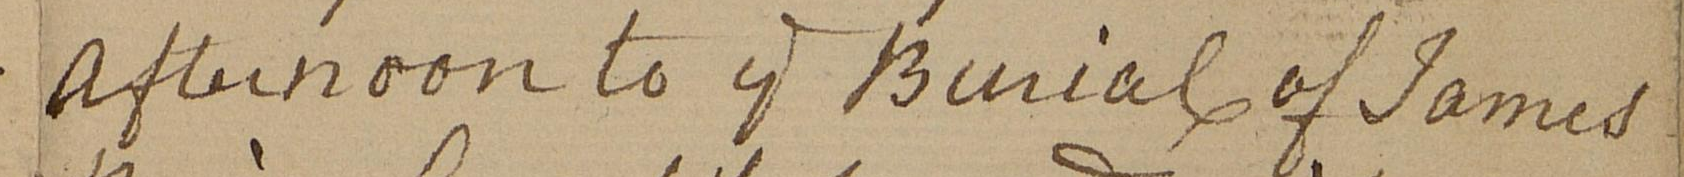Afternoon to y^e Burial of James
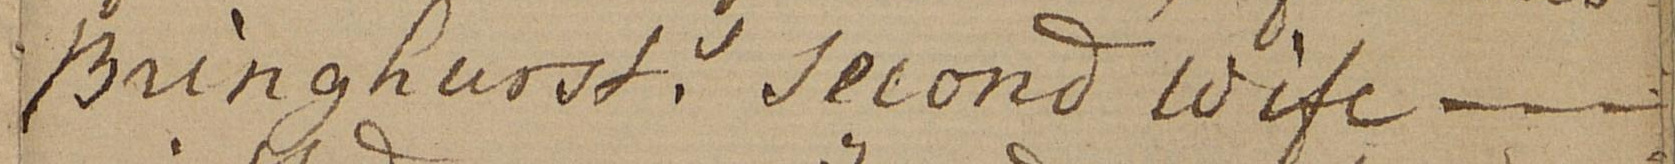Bringhurst^s. second wife-
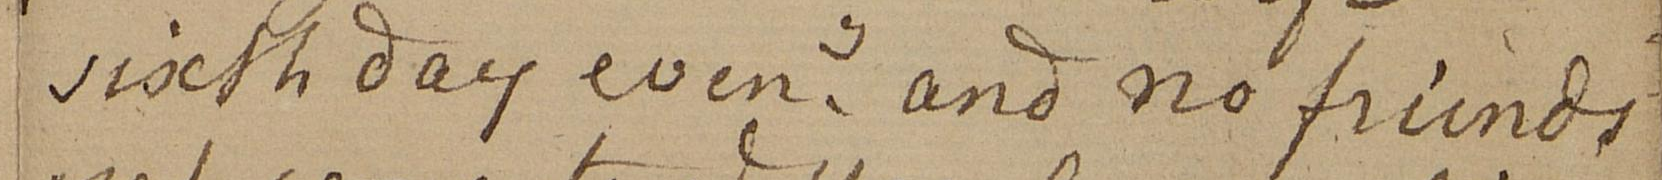sixth day even^g. and no friends
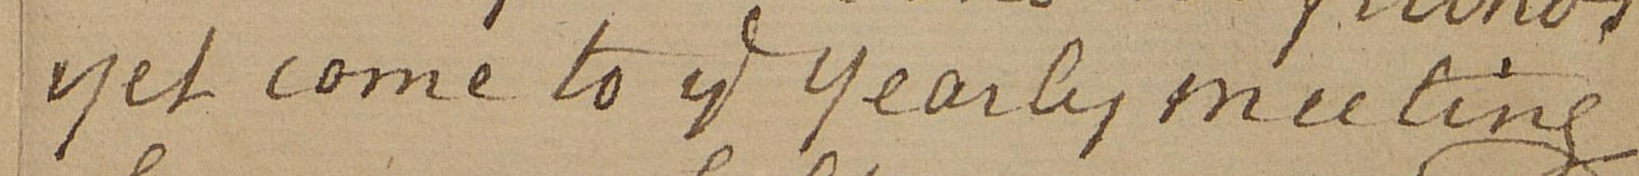yet come to y^e yearly meeting
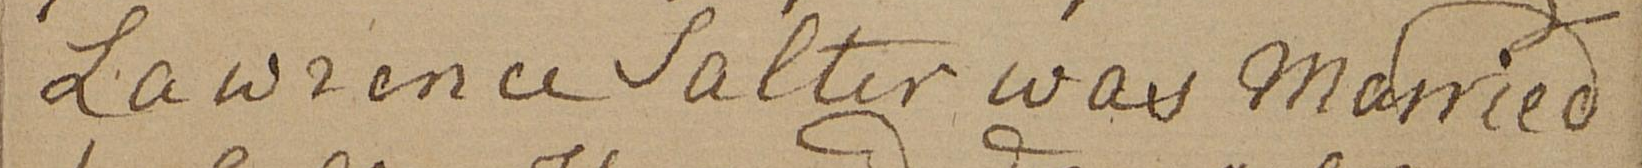Lawrence Salter was Married
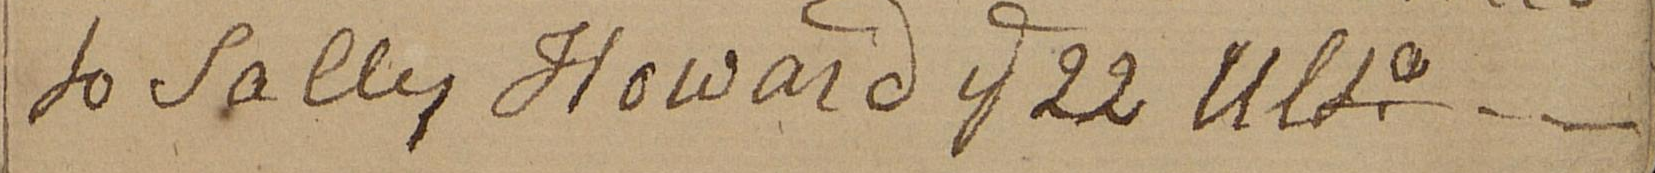to Sally Howard y^e 22 Ult^o-
